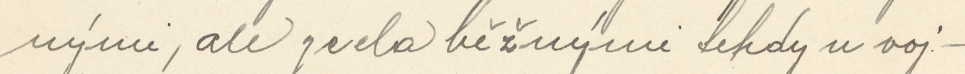nými, ale zcela běžnými tehdy u voj-
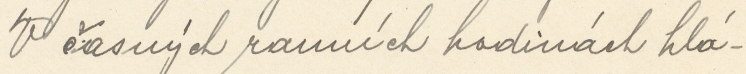V časných ranních hodinách hlá-
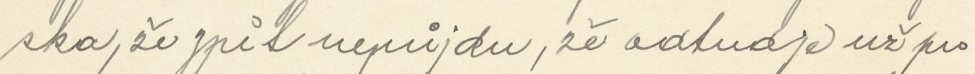ska, že zpět nepůjdu, že odtud je už pro
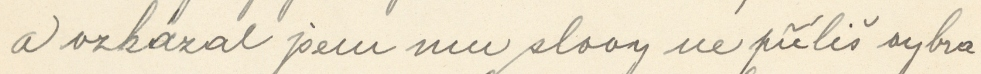a vzkázal jsem mu slovy ne příliš vybra-
